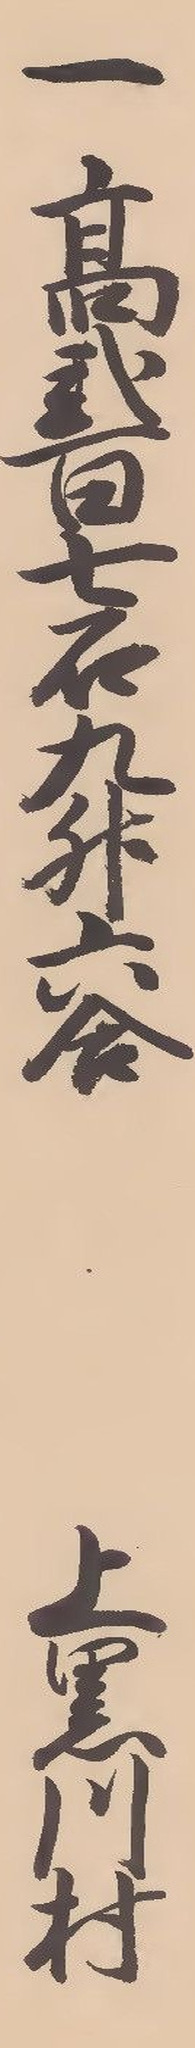一高弐百七石九升六合上黒川村
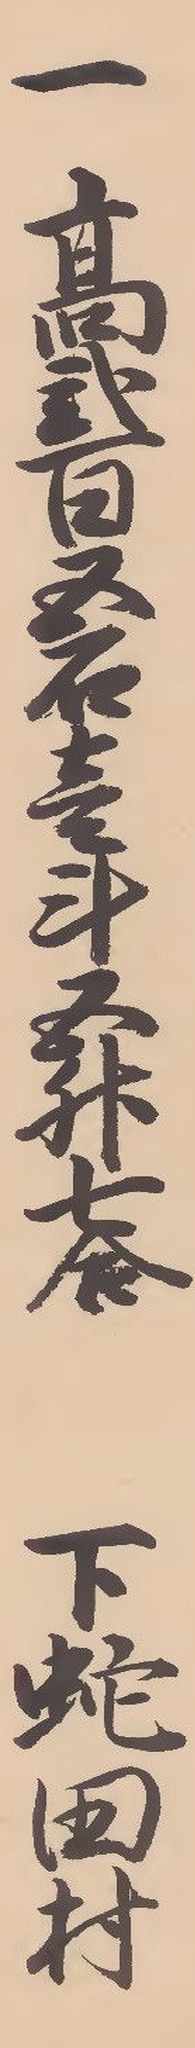一高弐百五石壱斗五升七合下蛇田村

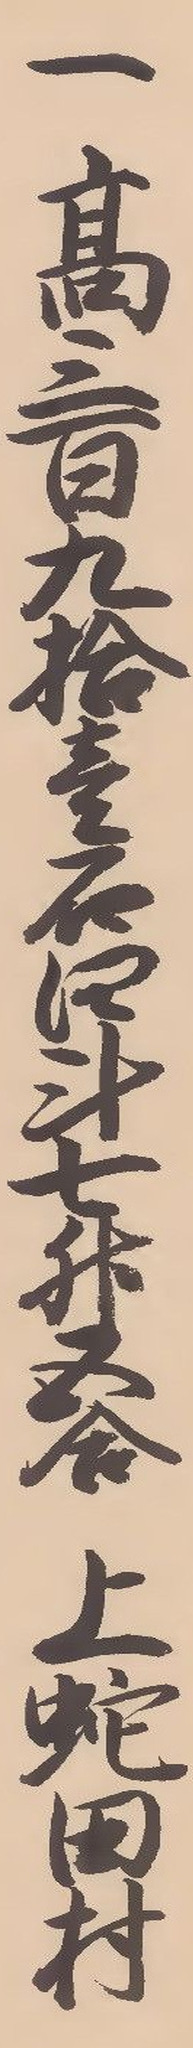一高三百九拾壱石四斗七升五合上蛇田村
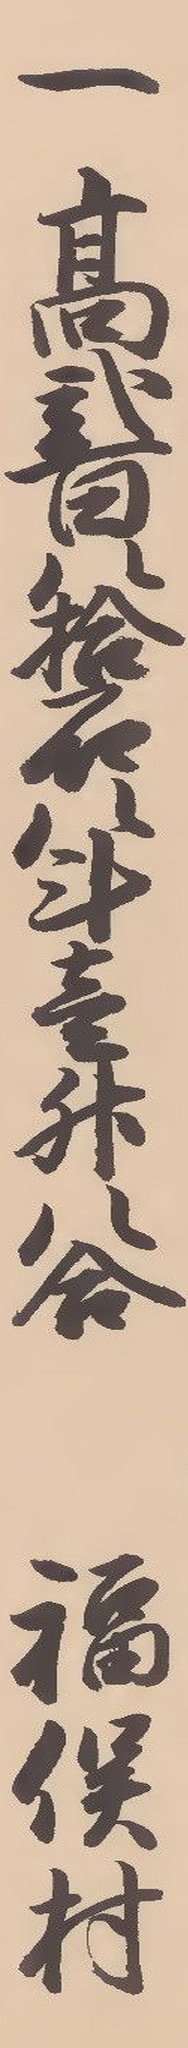一高弐百八拾石八斗壱升八合福俣村
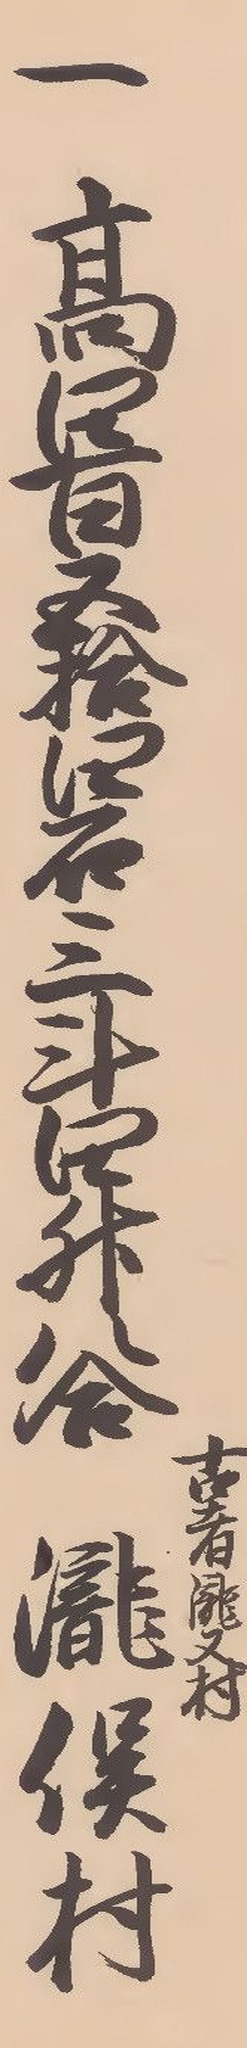一高四百五拾四石三斗四升八合滝俣村
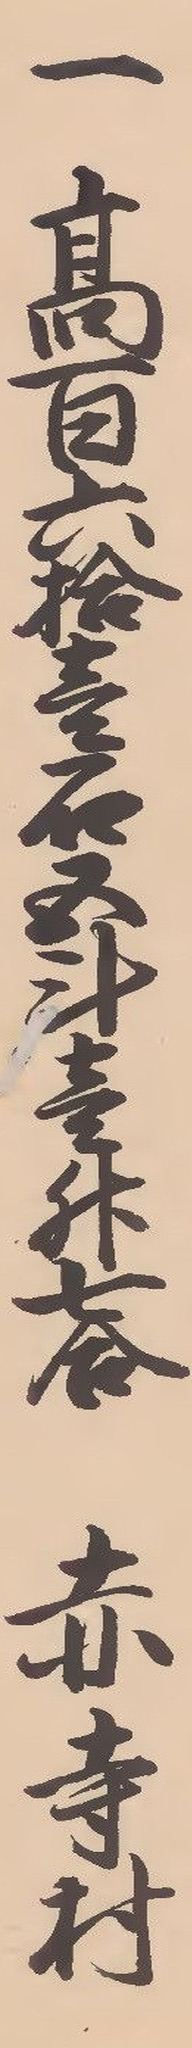一高百六拾壱石五斗壱升七合赤寺村
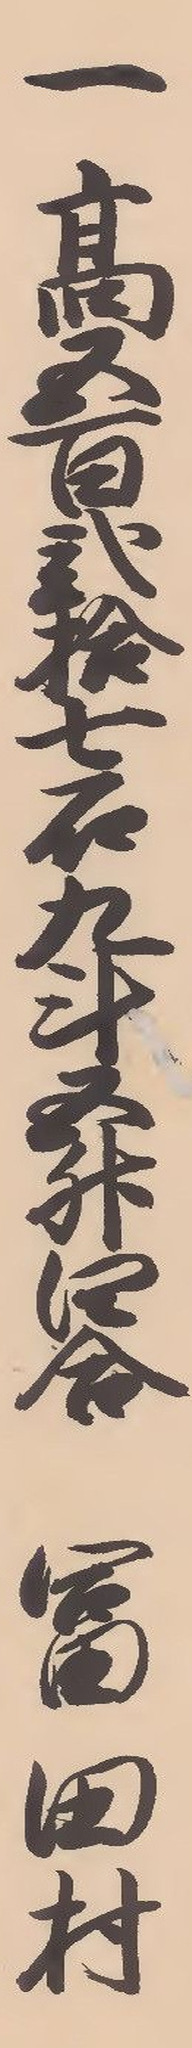一高五百弐拾七石九斗五升四合冨田村
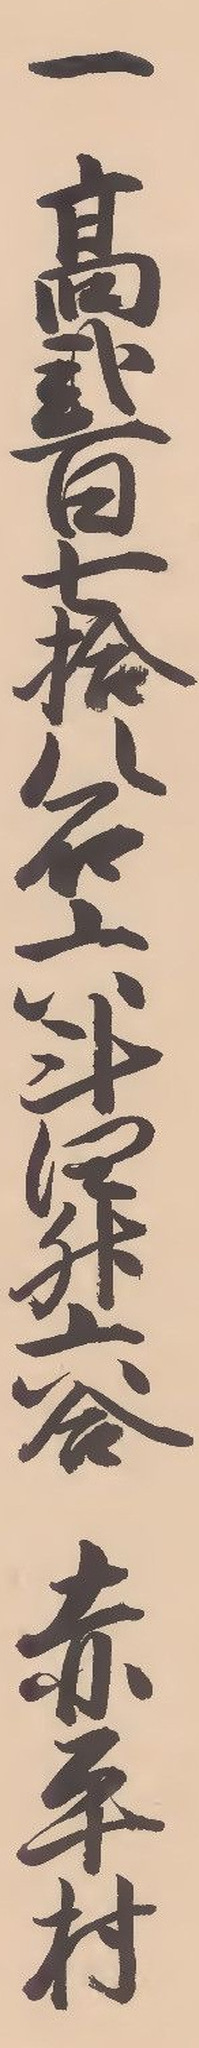一高弐百七拾八石六斗四升六合赤平村

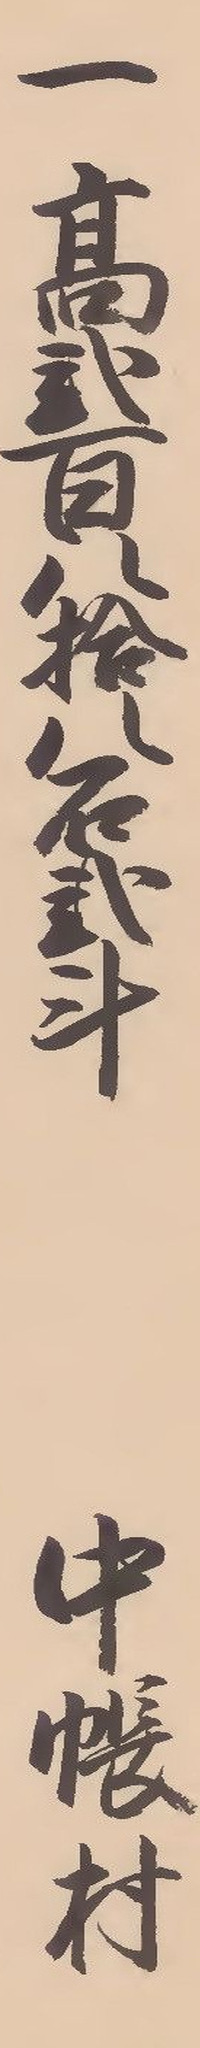一高弐百八拾八石弐斗中帳村
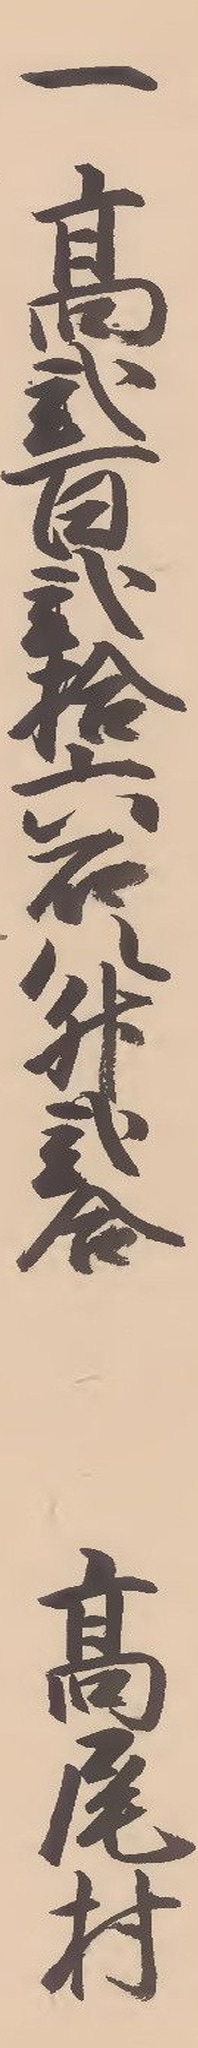一高弐百弐拾六石八升弐合高尾村
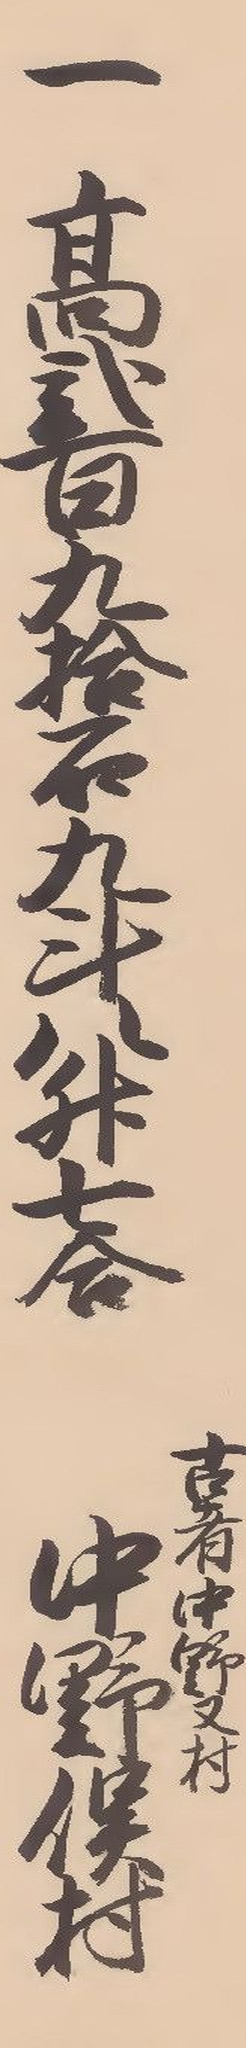一高弐百九拾石九斗八升七合中野俣村
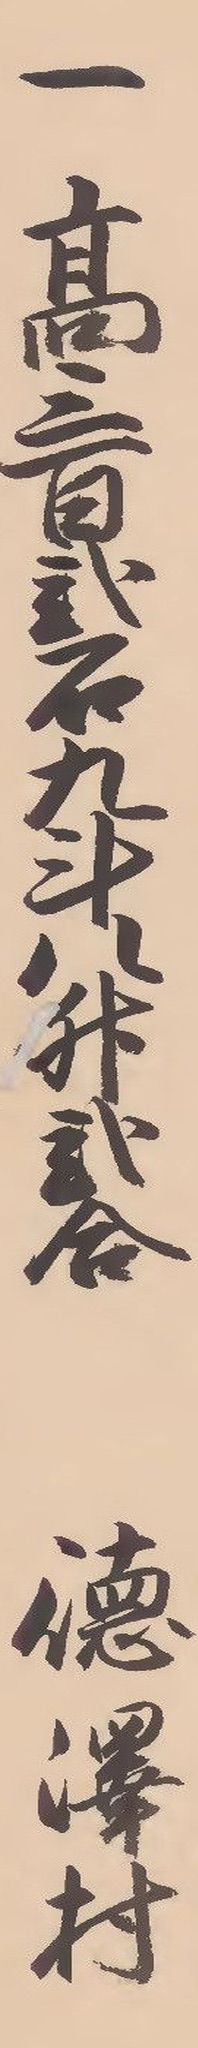一高三百弐石九斗八升弐合徳沢村
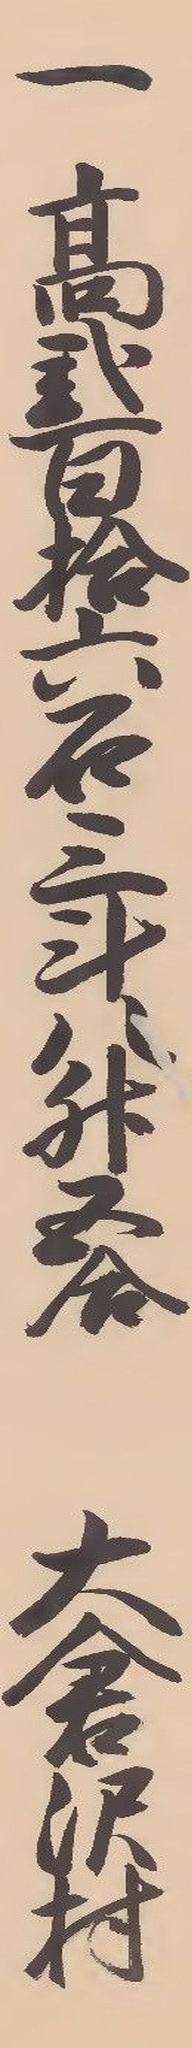一高弐百拾六石三斗八升五合大倉沢村
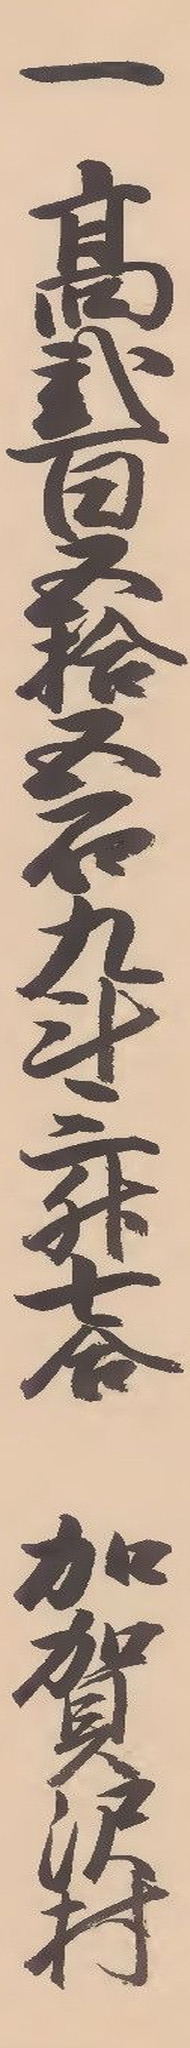一高弐百五拾五石九斗三升合七合加賀沢村
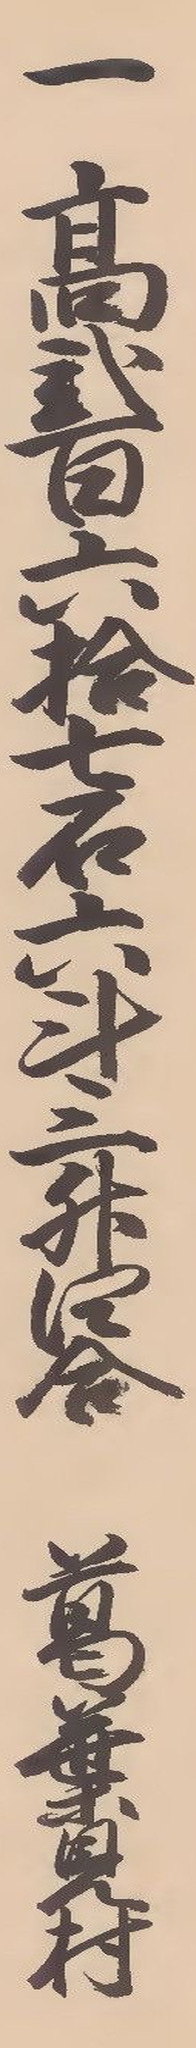一高弐百六拾七石六斗三升四合葛葉見村
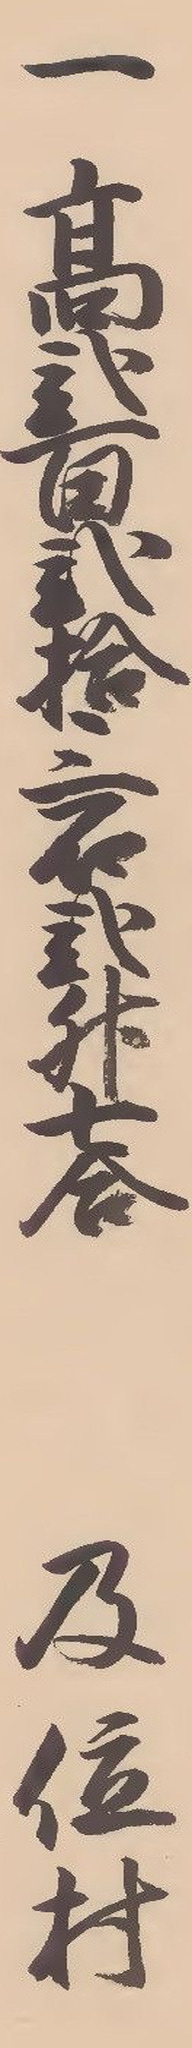一高弐百弐拾三石弐升七合及位村
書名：出羽国郷帳　５
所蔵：国立公文書館 National Archives of Japan
